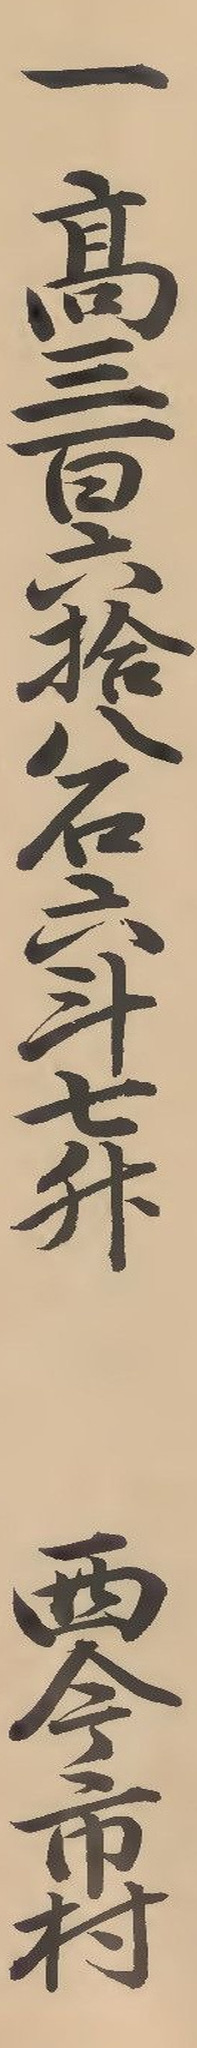一高三百六拾八石六斗七升西今市村
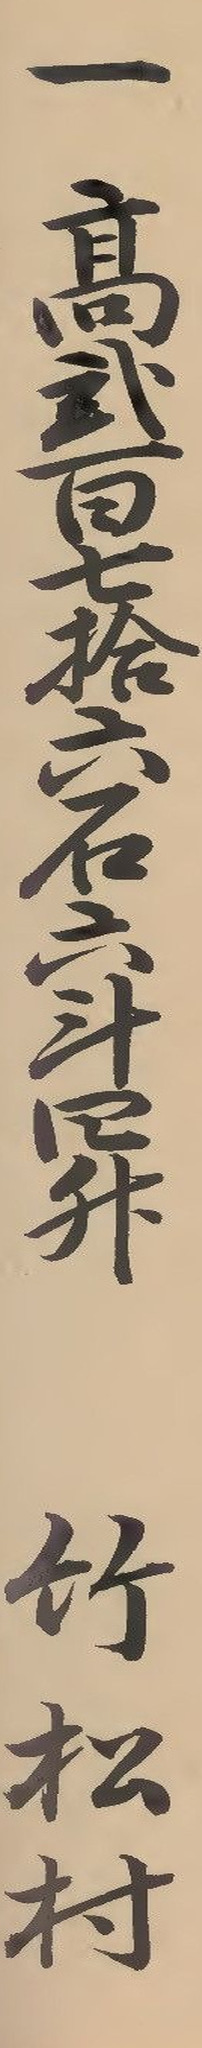一高弐百七拾六石六斗四升竹松村
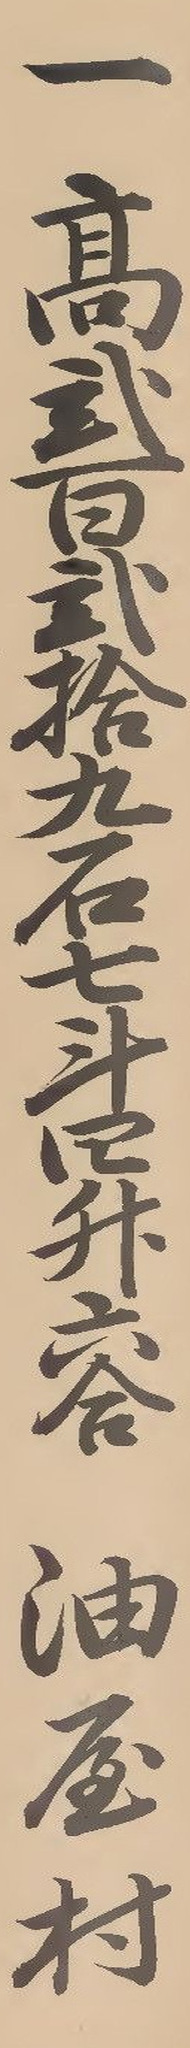一高弐百弐拾九石七斗四升六合油屋村
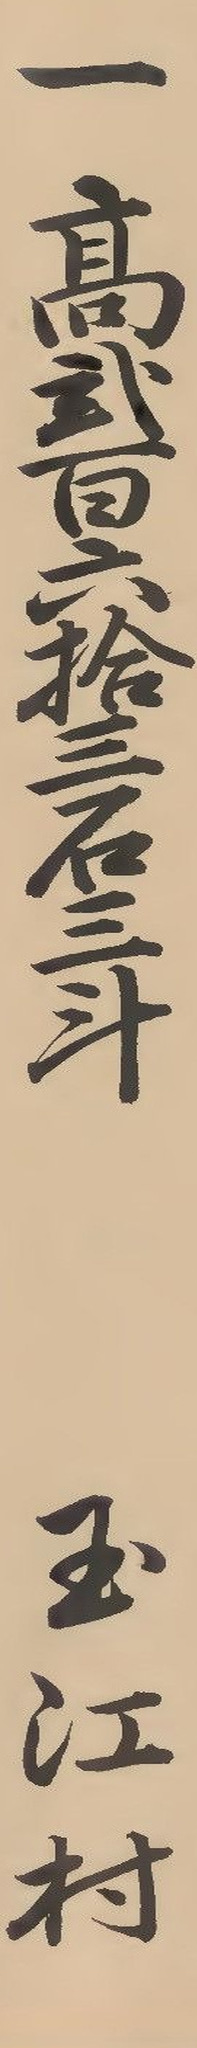一高弐百六拾三石三斗玉江村
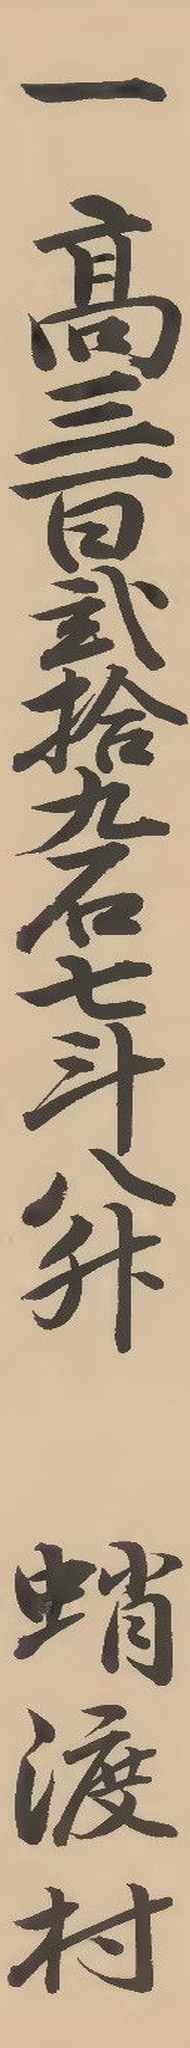一高三百弐拾九石七斗八升蛸渡村
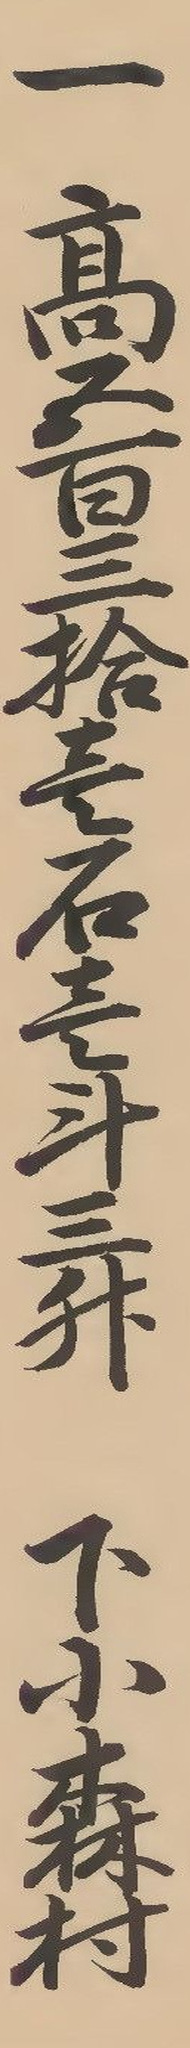一高五百三拾壱石壱斗三升下小森村

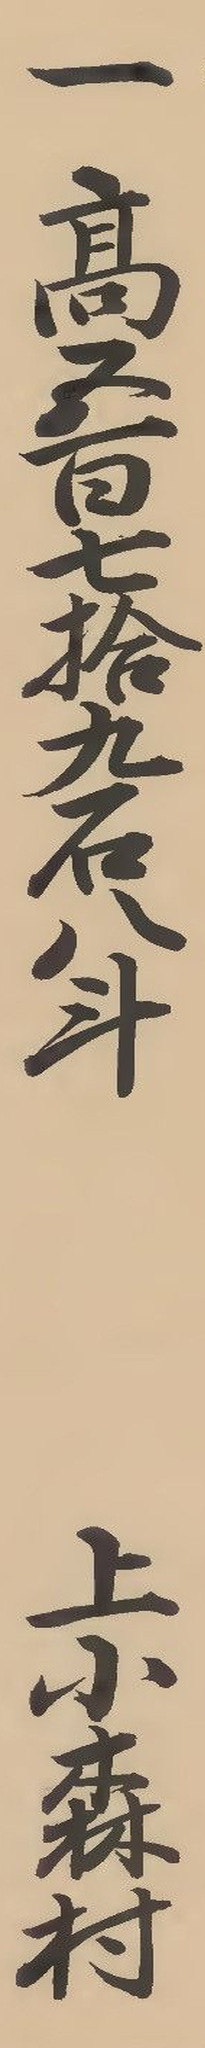一高五百七拾九石八斗上小森村
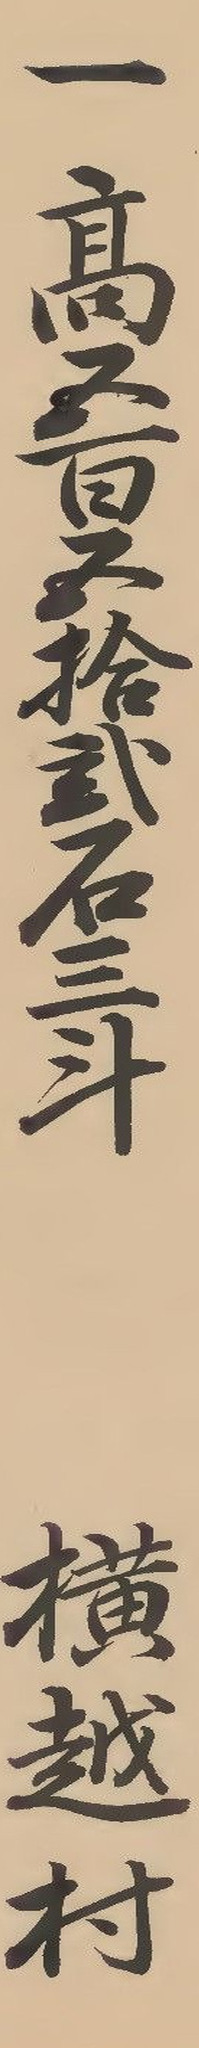一高五百五拾弐石三斗横越村
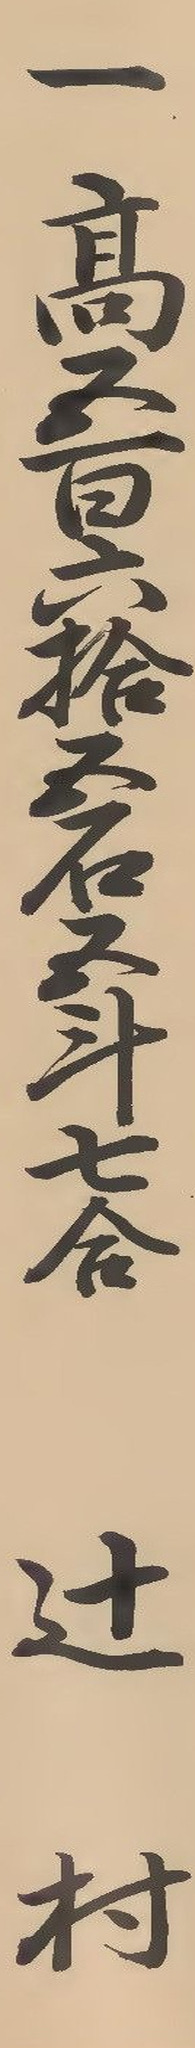一高五百六拾五石五斗七合辻村
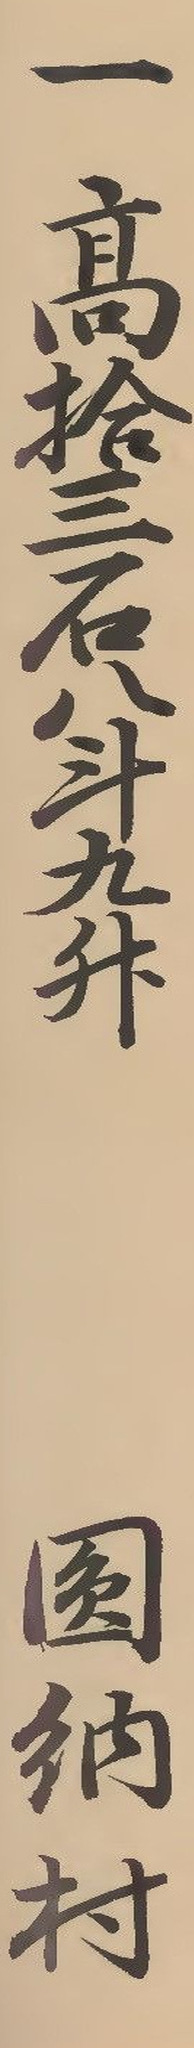一高拾三石八斗九升円納村
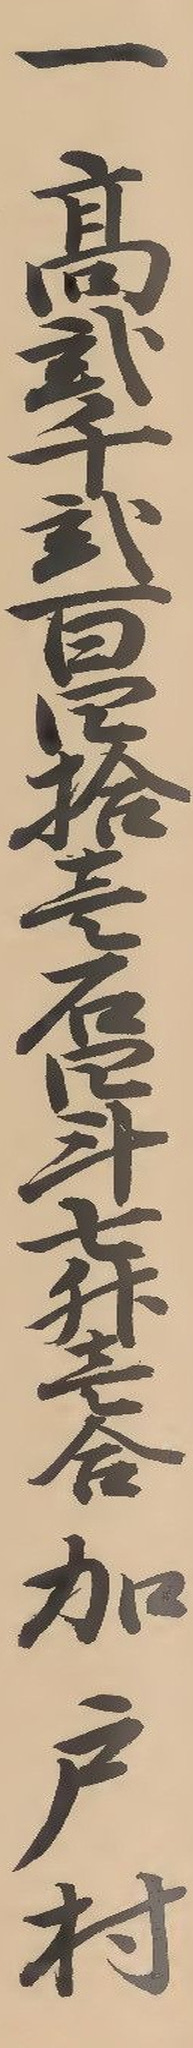一高弐千弐百四拾壱石四斗七升壱合加戸村
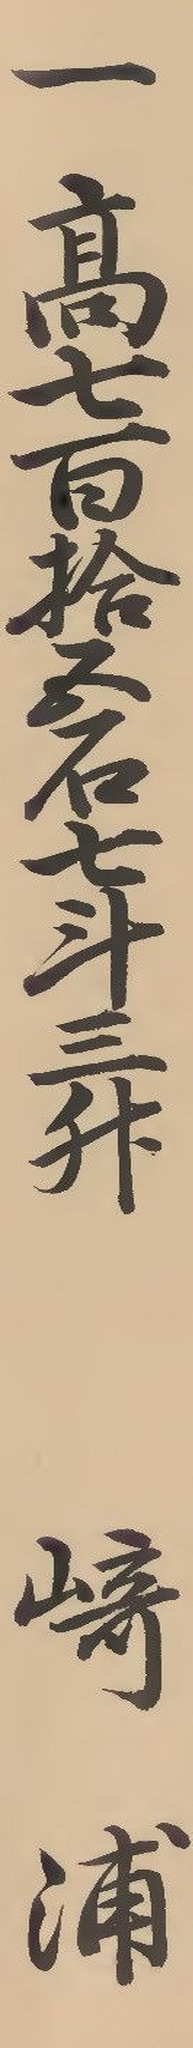一高七百拾五石七斗三升崎浦
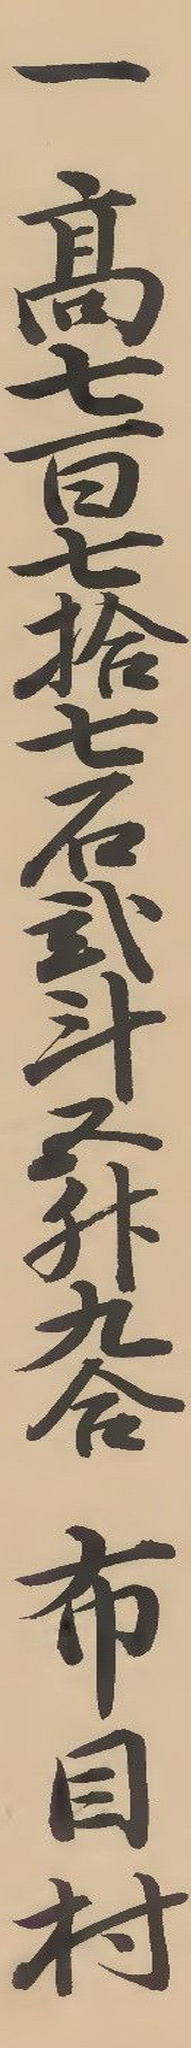一高七百七拾七石弐斗五升九合布目村
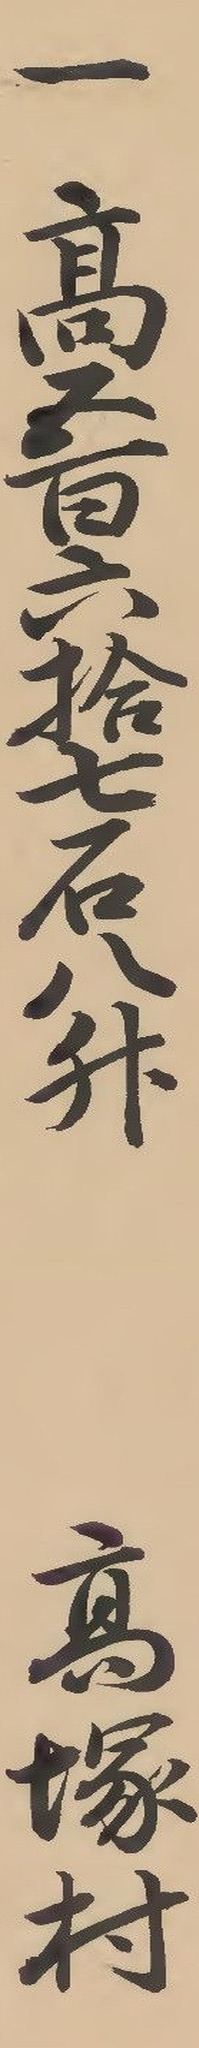一高五百六拾七石八升高塚村

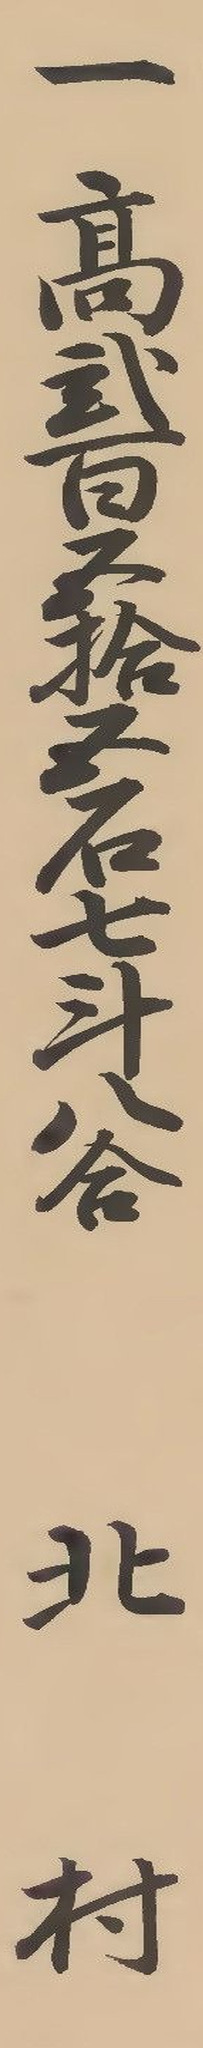一高弐百五拾五石七斗八合北村
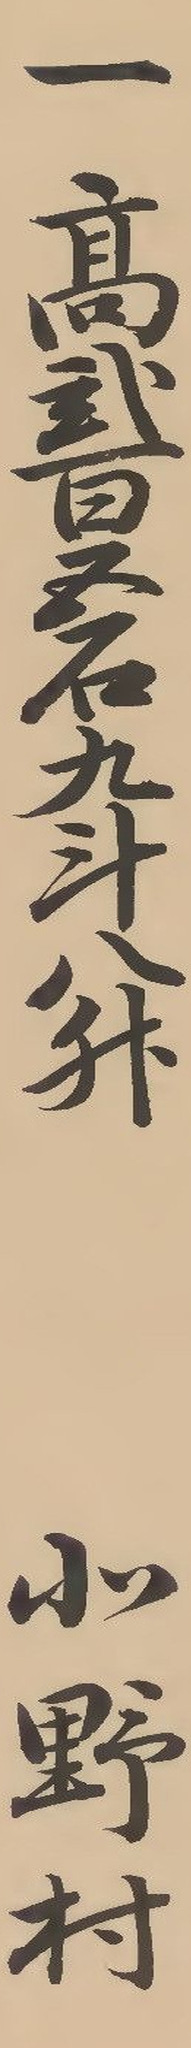一高弐百五石九斗八升北野村
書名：越前国郷帳
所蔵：国立公文書館 National Archives of Japan
